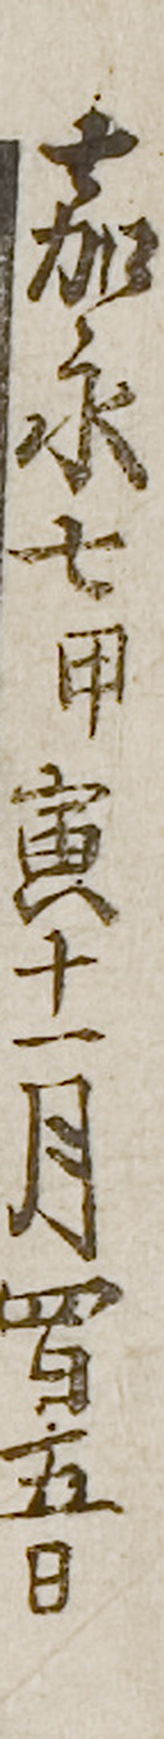嘉永七甲寅十一月四日五日
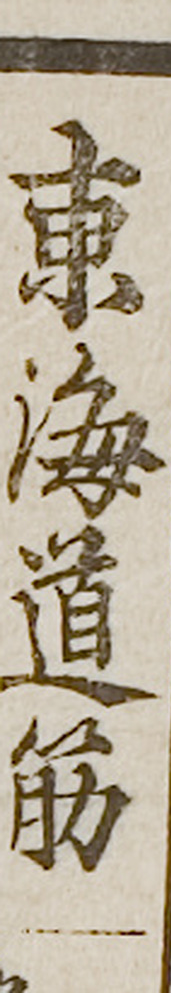東海道筋
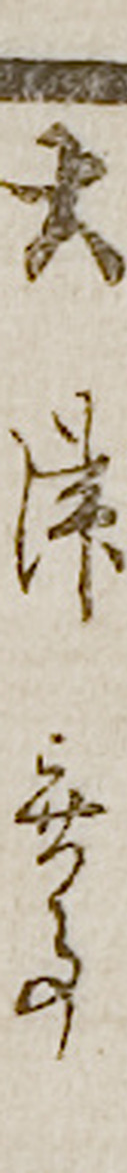大津無事
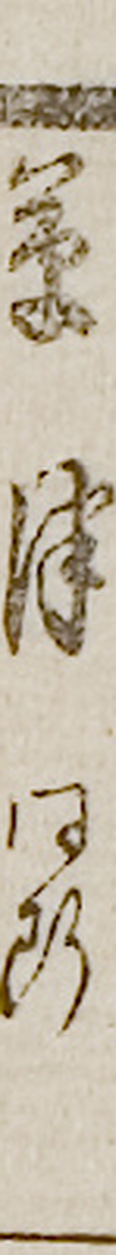草津同断
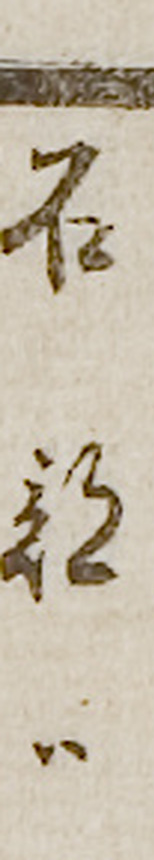石部〃
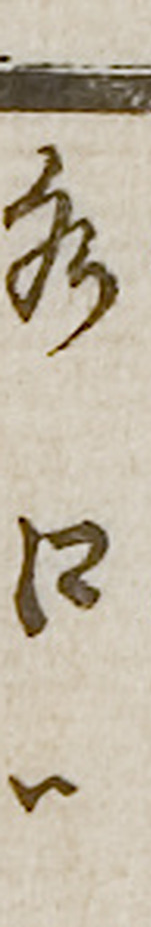水口〃
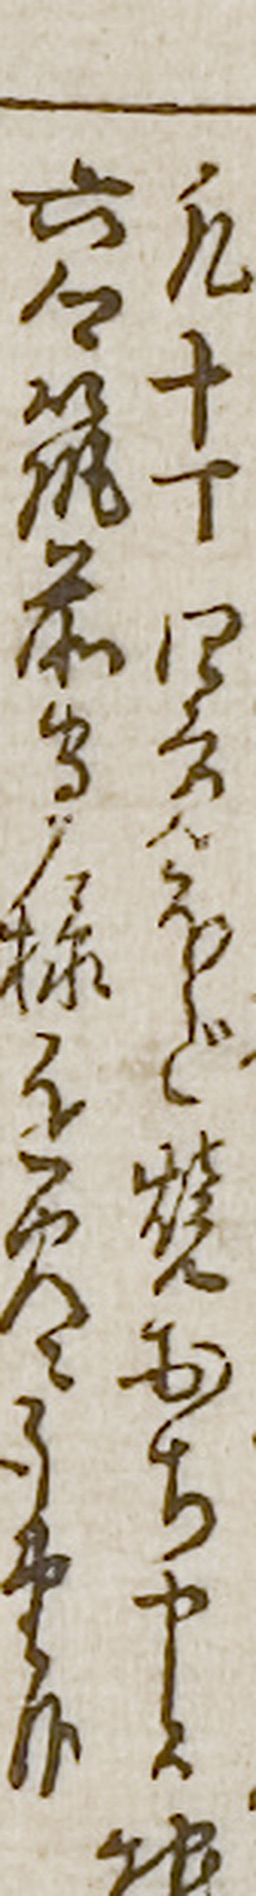六郷筑前守様近火に御坐候
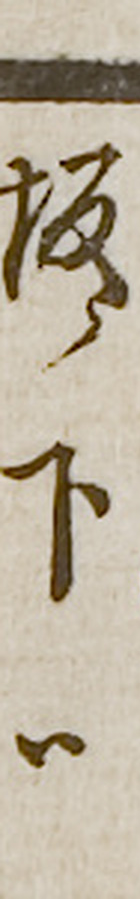坂下〃
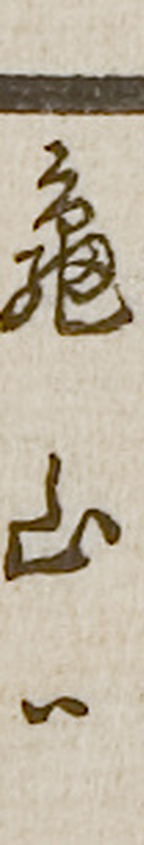亀山〃
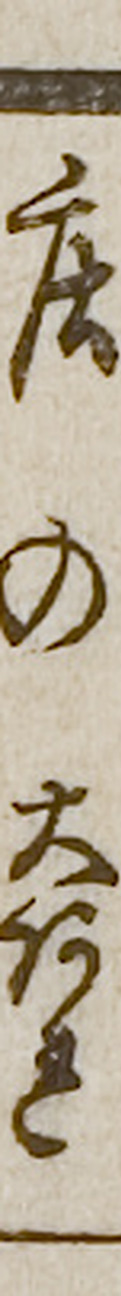庄の大あれ
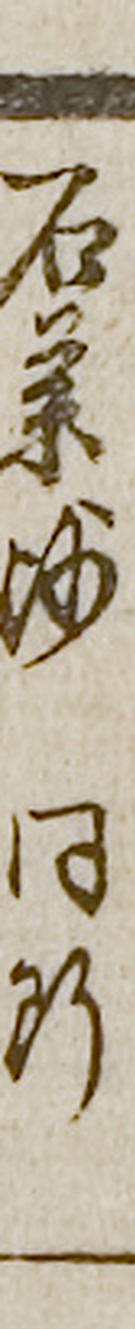石薬師同断
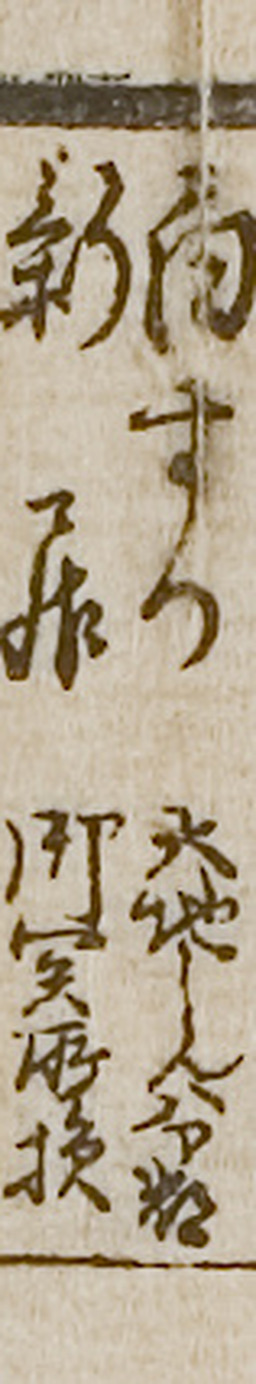新居御関所損
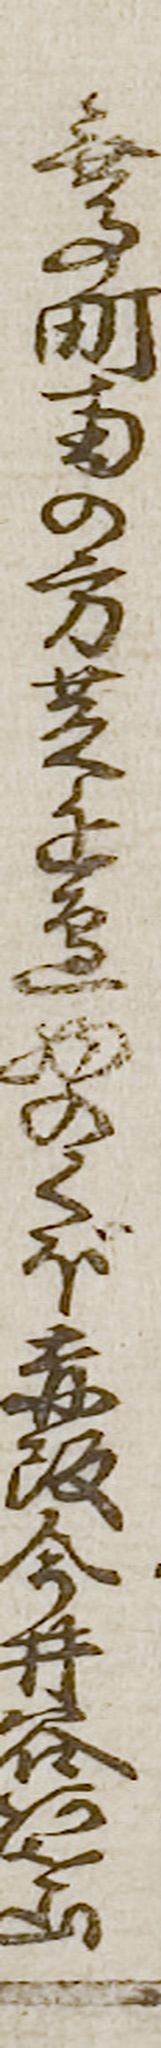無事町南の方芝近辺西のくぼ赤阪今井谷あを山
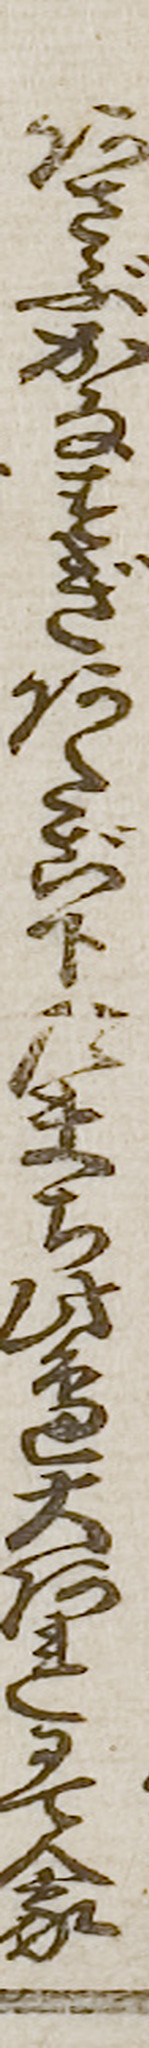あさぶかなすぎあたご下たまち此辺大あれにて人家
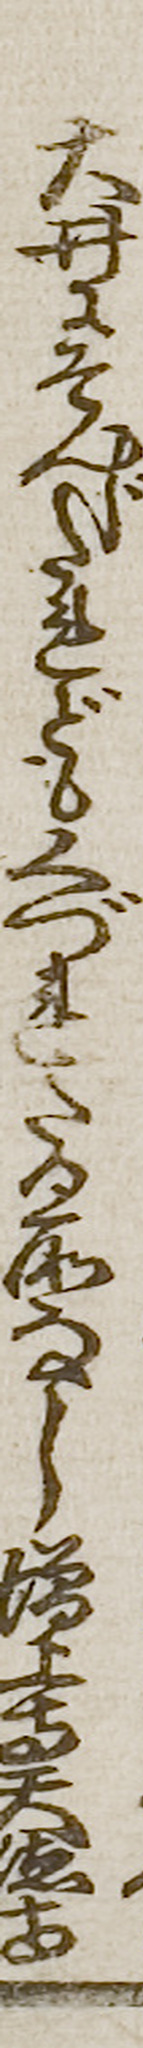大いにそんじたれどもくづれたる所なし増上寺天徳寺
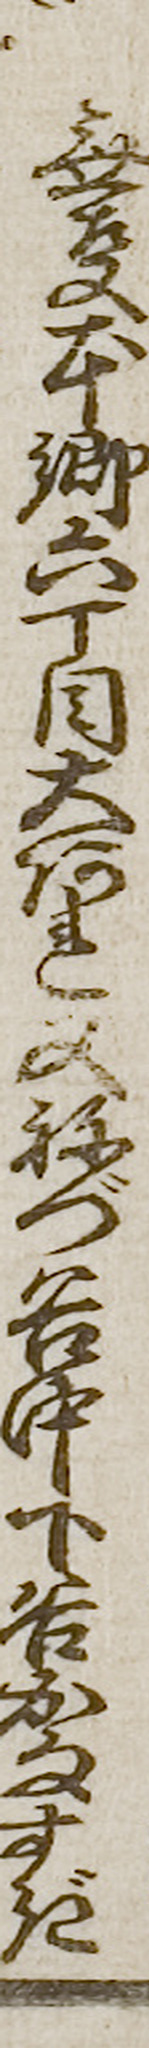無事本郷六丁目大あれ又ねづ谷中下谷かなすぎ
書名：江戸大地震出火之図
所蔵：東京大学総合図書館 General Library in the University of Tokyo, JAPAN
